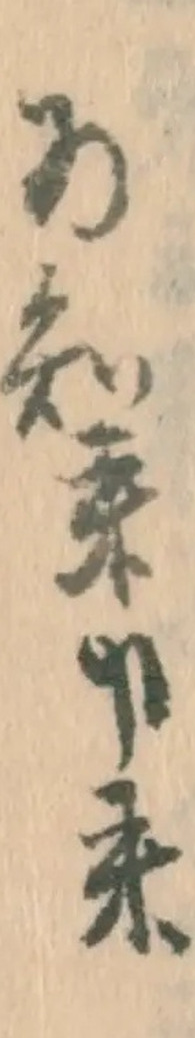為知参申来
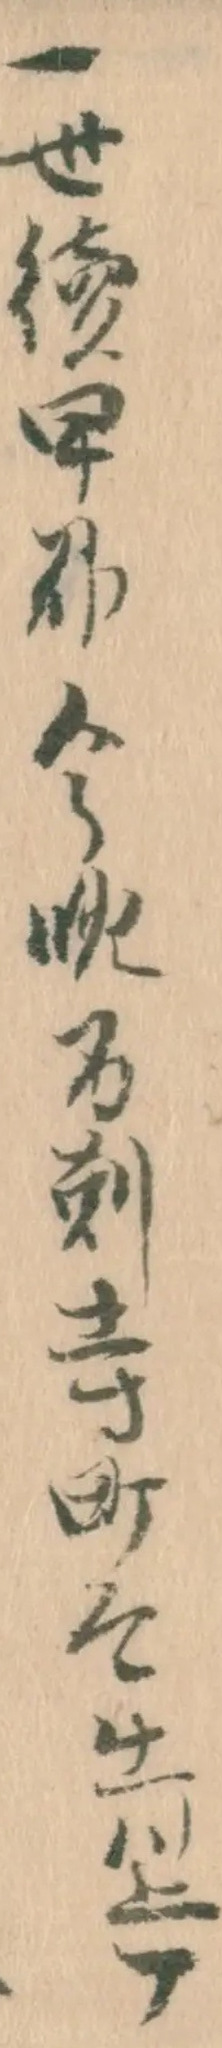一世続甲州今晩酉刻寺町今出川上丁
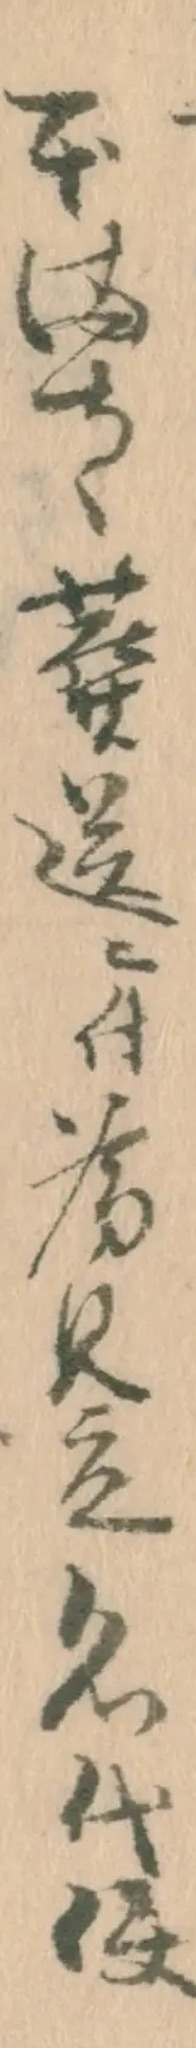本満寺へ葬送ニ付為見立名代使
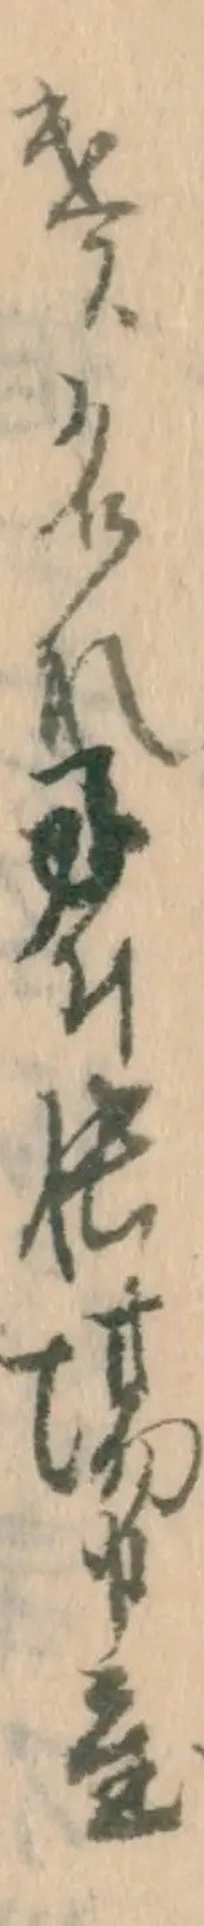遣ス名札事付帳場申置
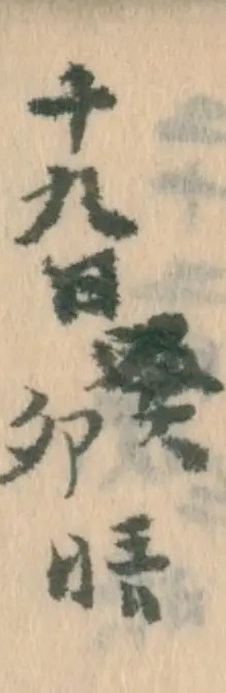十九日癸卯晴
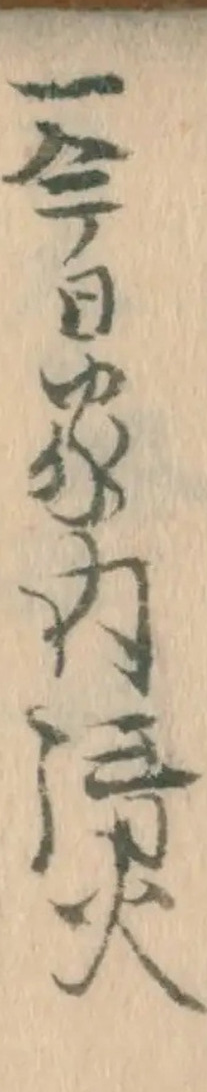一今日家内清火
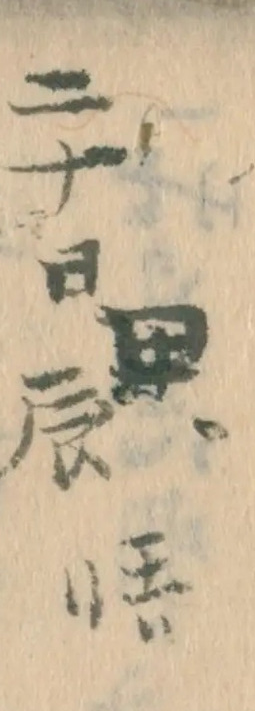二十日甲辰晴
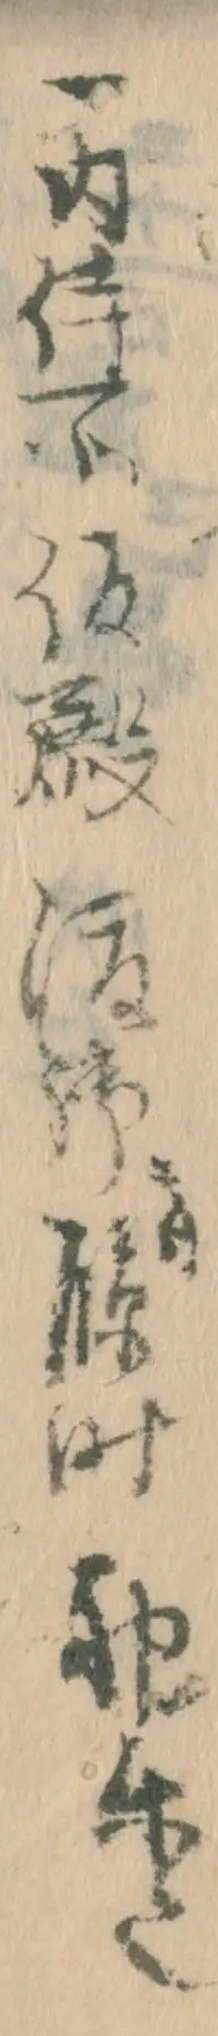一内侍所仮殿渡御ニ付臨時神楽也

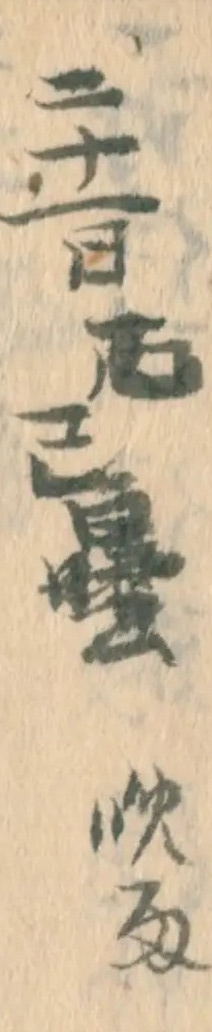二十一日乙巳曇晩雨
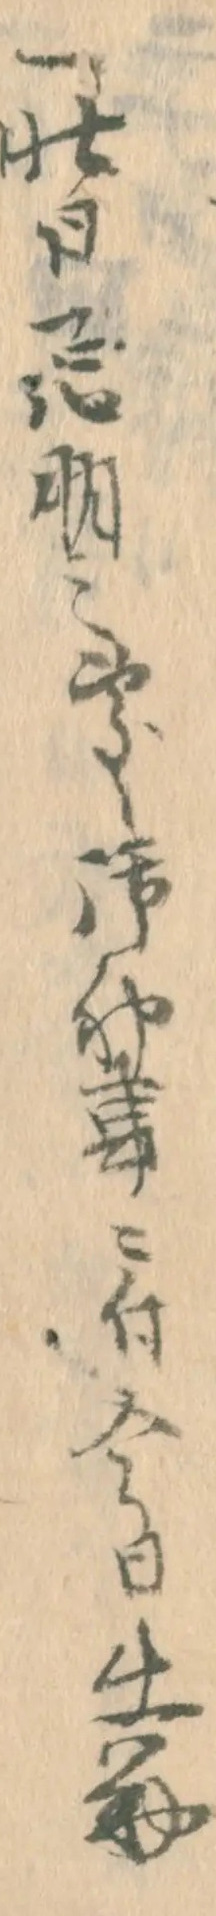一昨日忌明之処御神事ニ付今日出勤
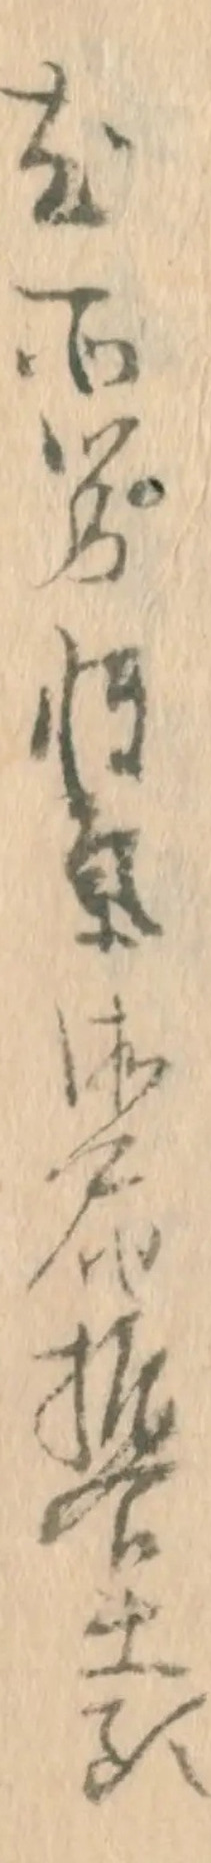尤所労快気御届振合出頭
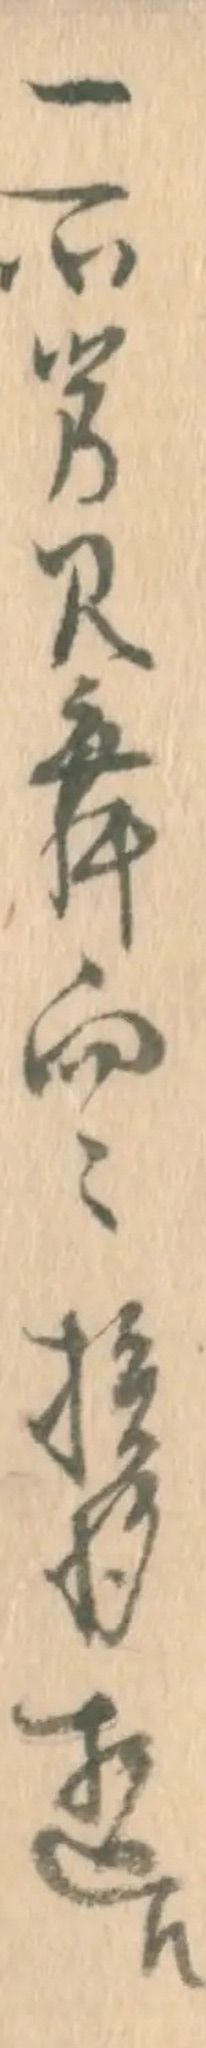一所労見舞向々挨拶相廻ル
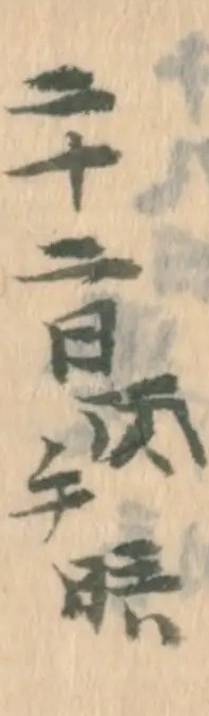二十二日丙午晴
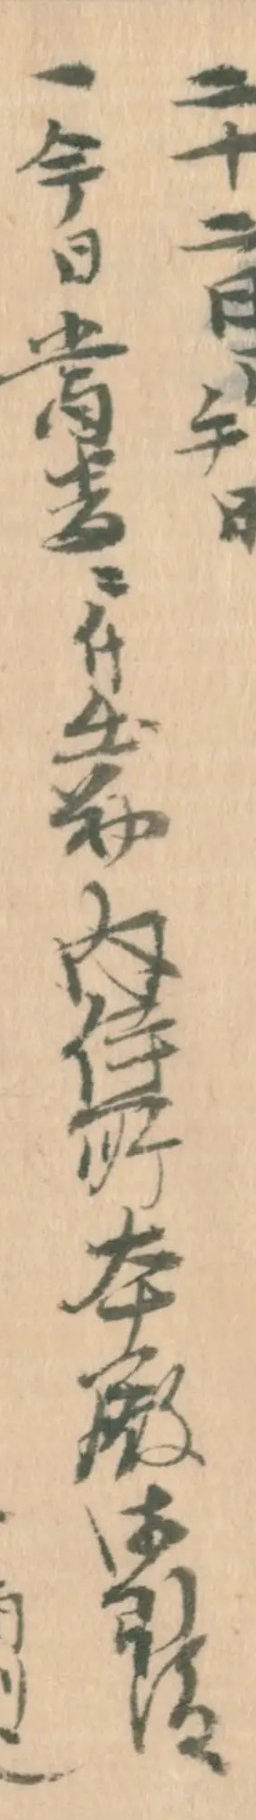一今日当番ニ付出勤内侍所本殿御引渡
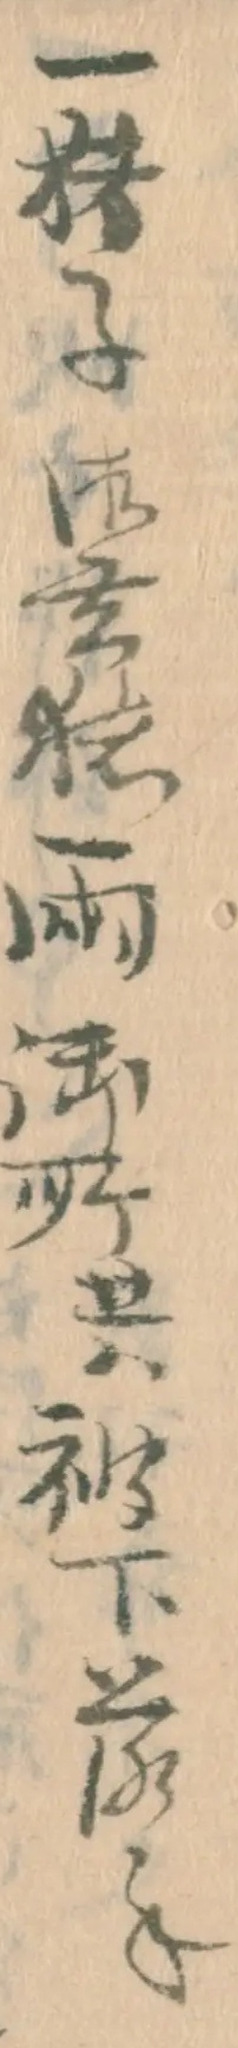一猪子御玄猪両御所共被下落手
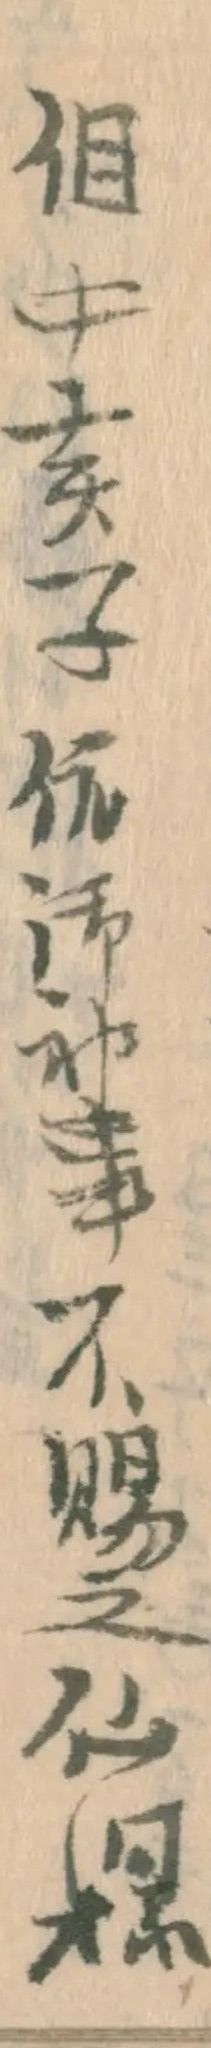但中亥子依御神事不賜之仙洞様
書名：禁裏御所御用日記. [131]
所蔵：国立国会図書館 National Diet Library, JAPAN
